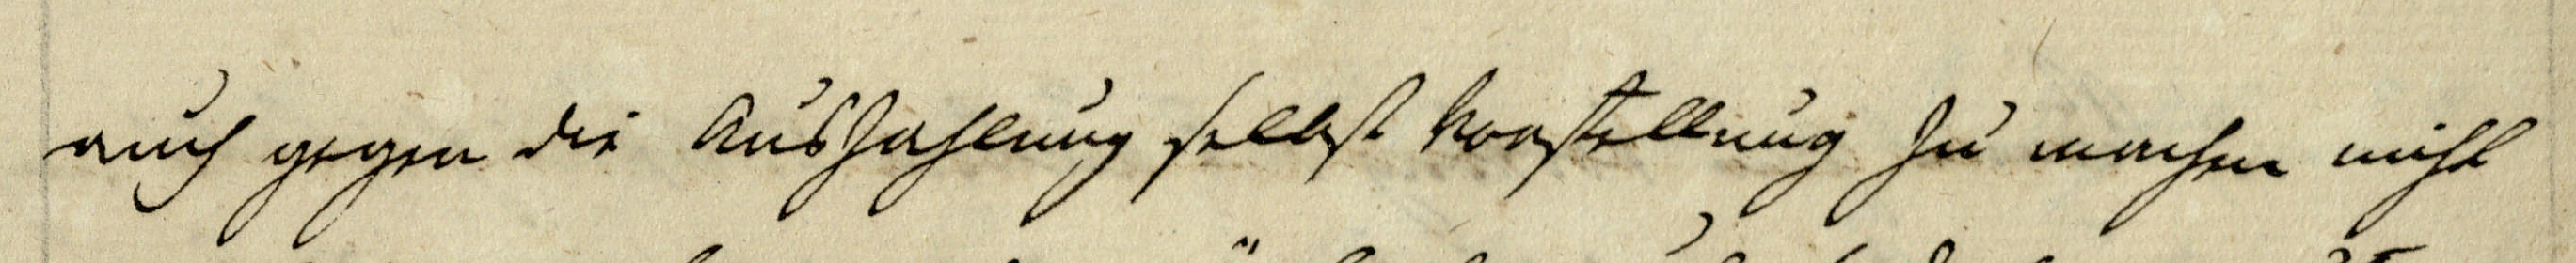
auch gegen die Auszahlung selbst Vorstellung zu machen nicht
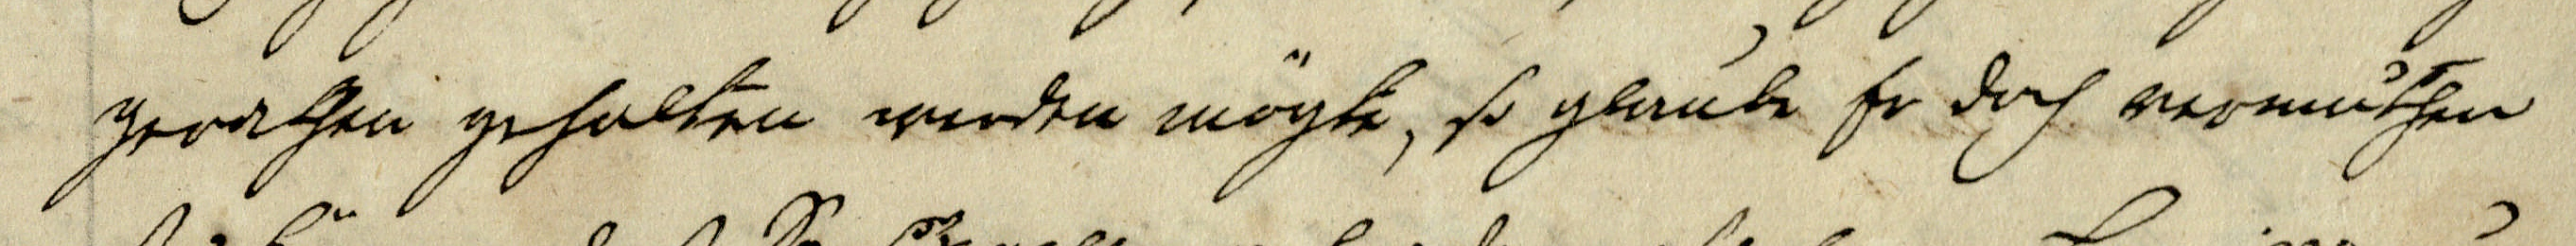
gerathen gehalten werden mögte, so glaube Er doch vermuthen
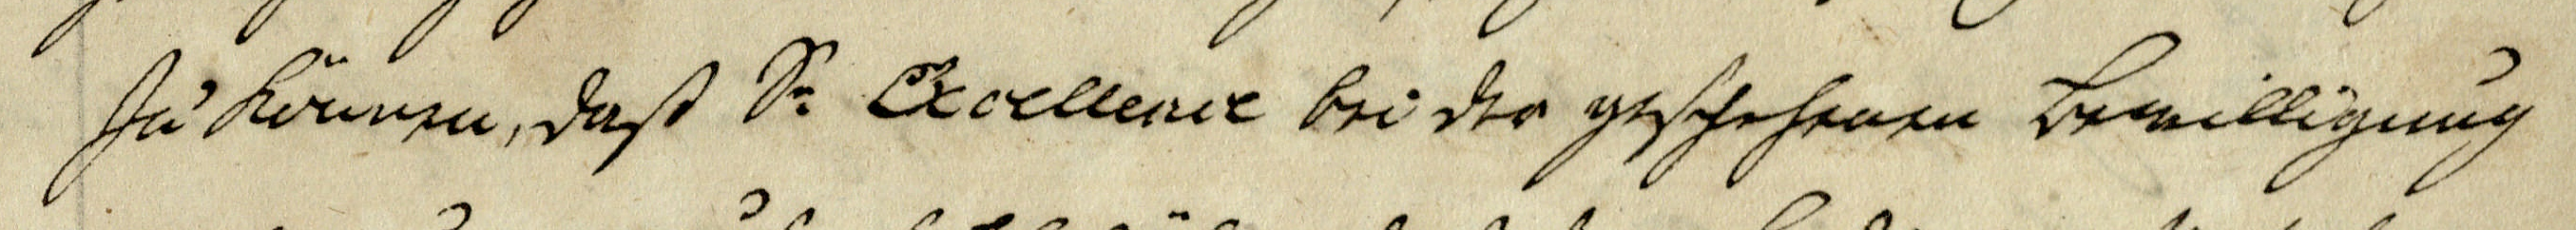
zu können, daß Sr Excellence bei der geschehenen Bewilligung
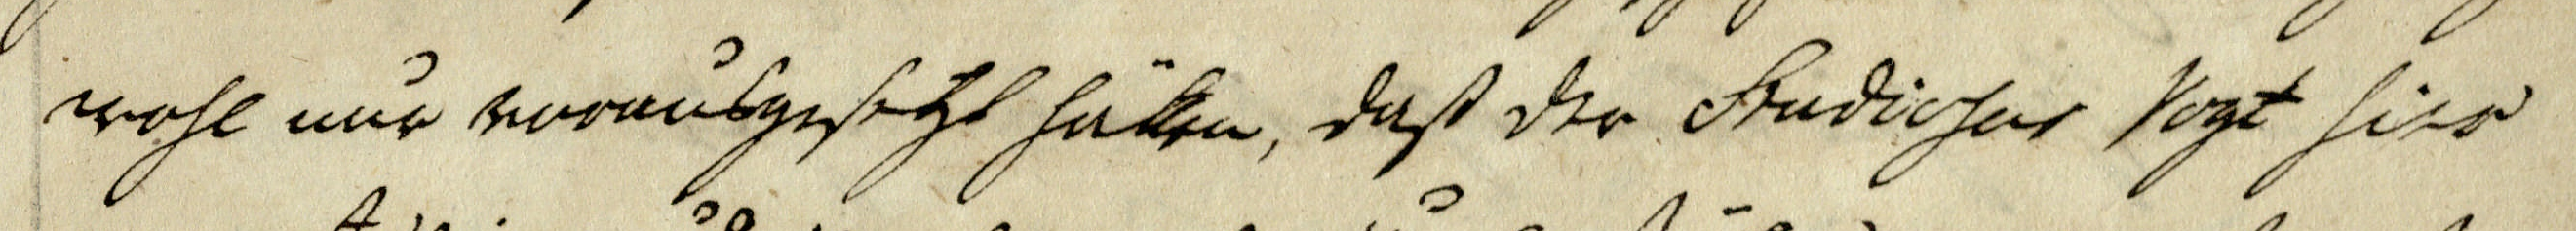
wohl nur vorausgesetzt hätten, daß der Studiosus Vogt hier
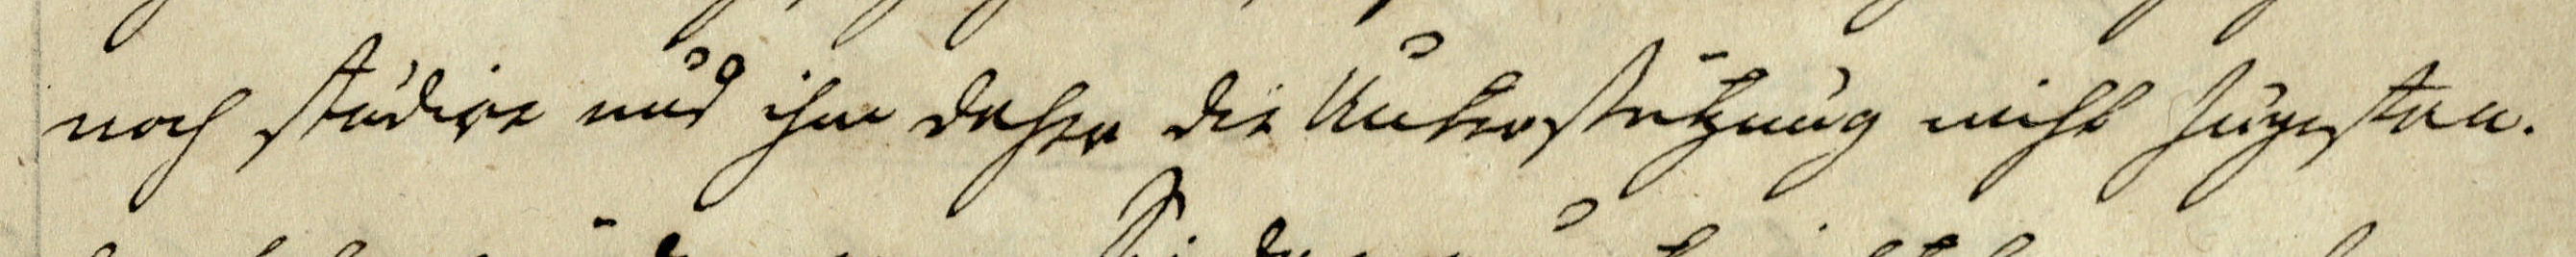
noch studire und ihm daher die Unterstützung nicht zugestan¬
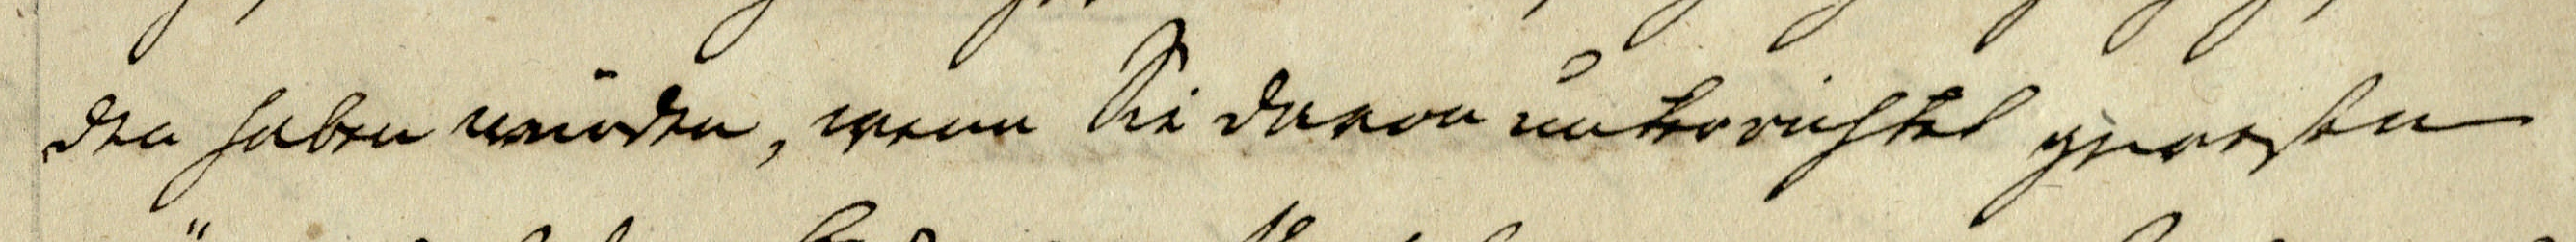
den haben würden, wenn Sie davon unterrichtet gewesen
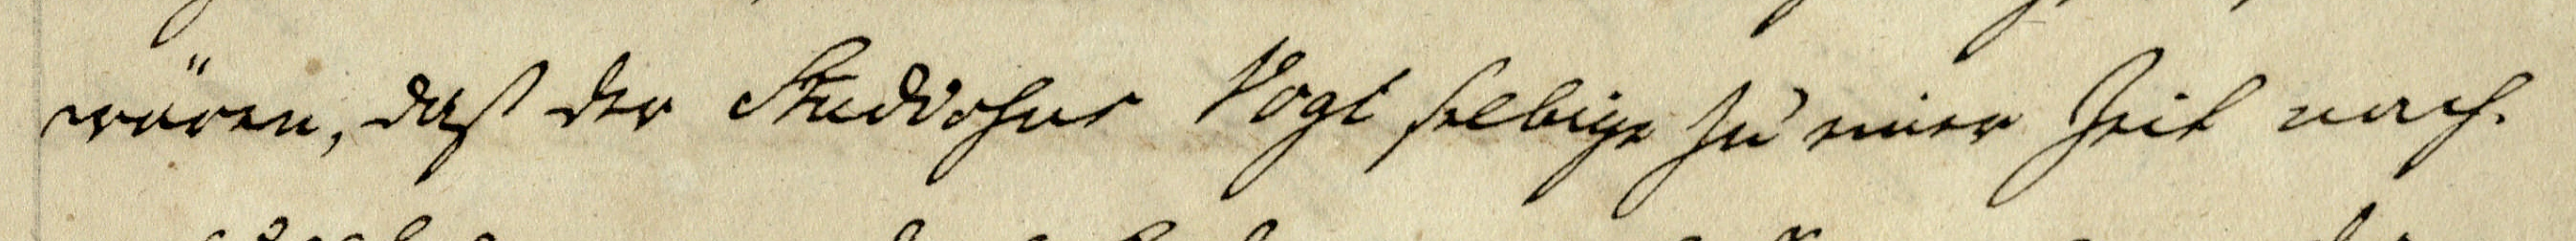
wären, daß der Studiosus Vogt selbige zu einer Zeit nach¬
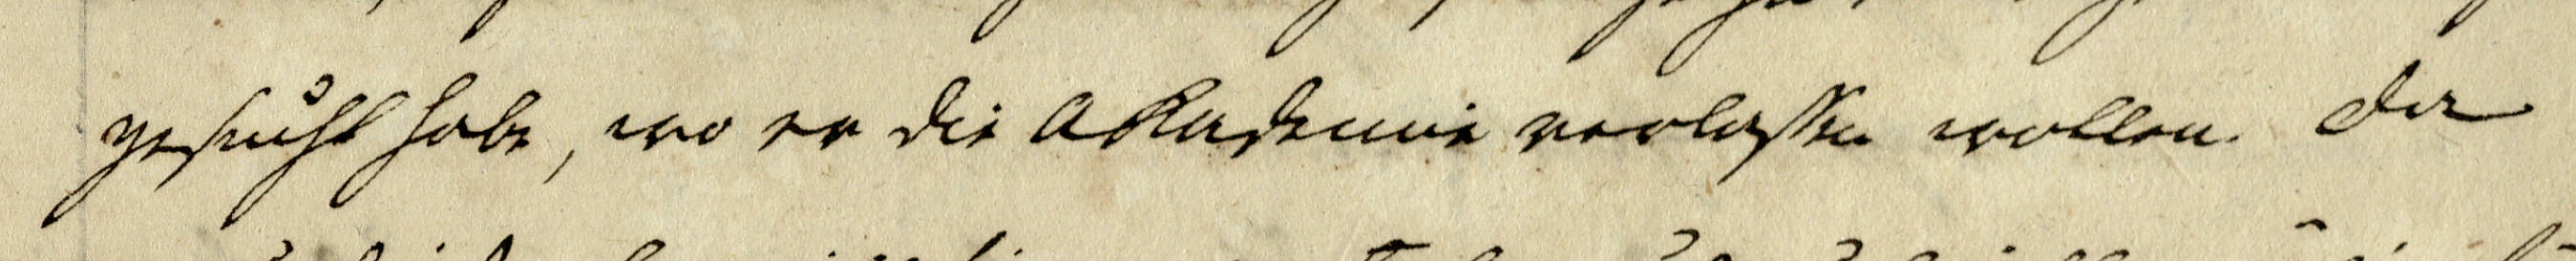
gesucht habe, wo er die Akademie verlassen wollen. Da
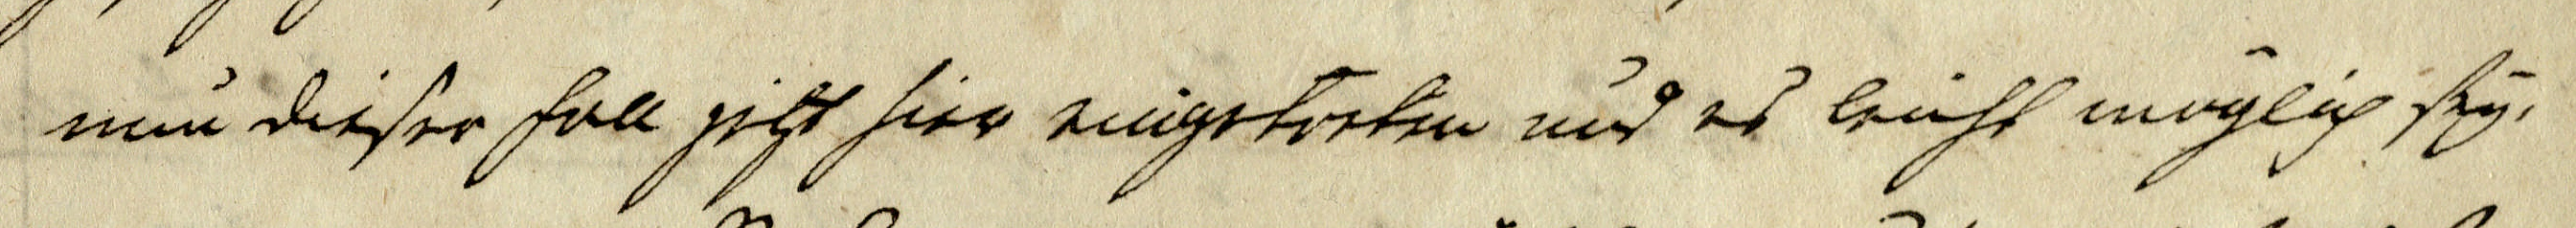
nun dieser Fall jetzt hier eingetreten und es leicht möglich seÿ,
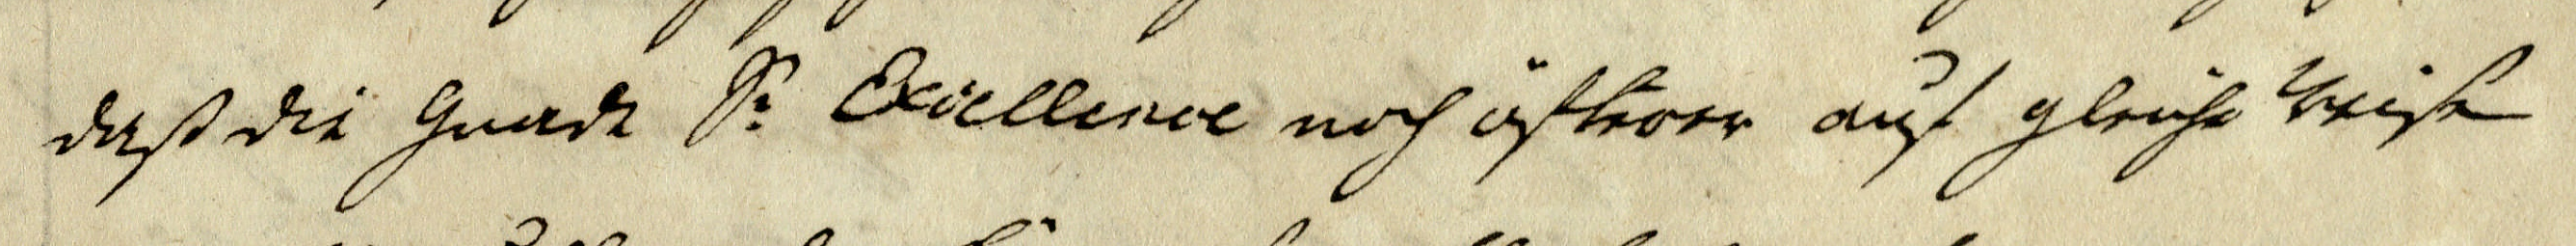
daß die Gnade Sr Excellence noch öfterer auf gleiche Weise
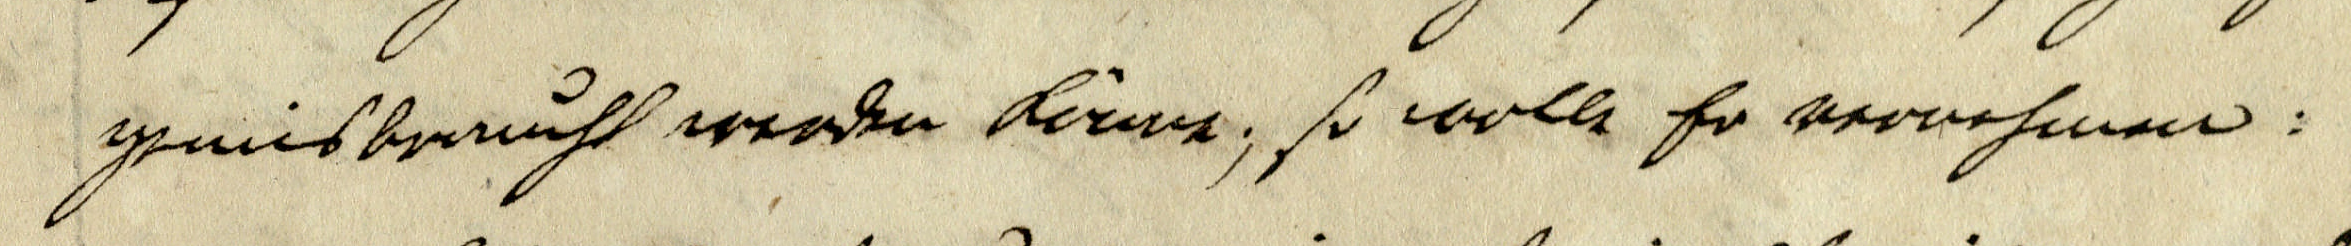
gemisbraucht werden könne; so wolle Er vernehmen:
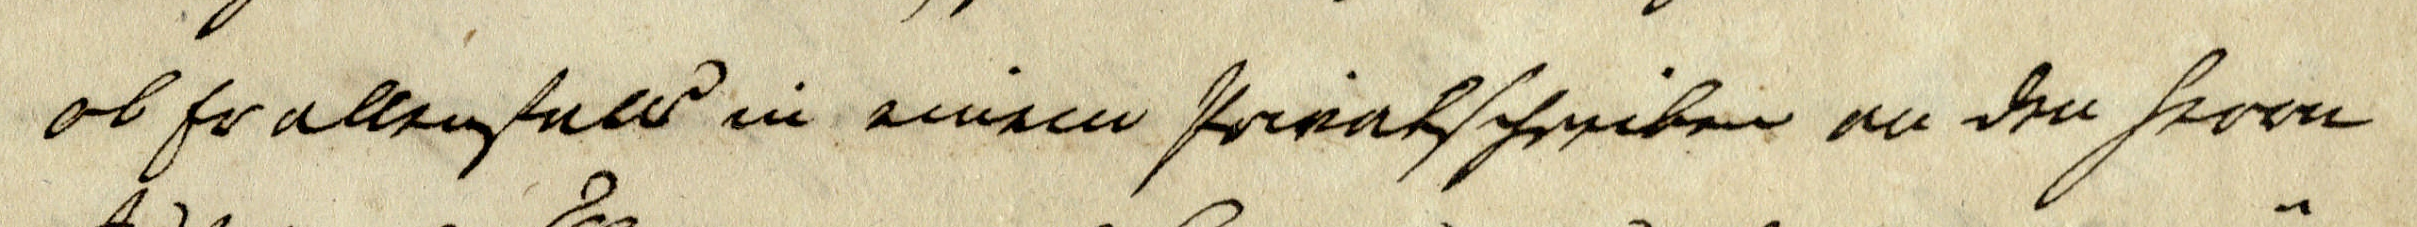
ob Er allenfalls in einem Privatschreiben an den Herrn
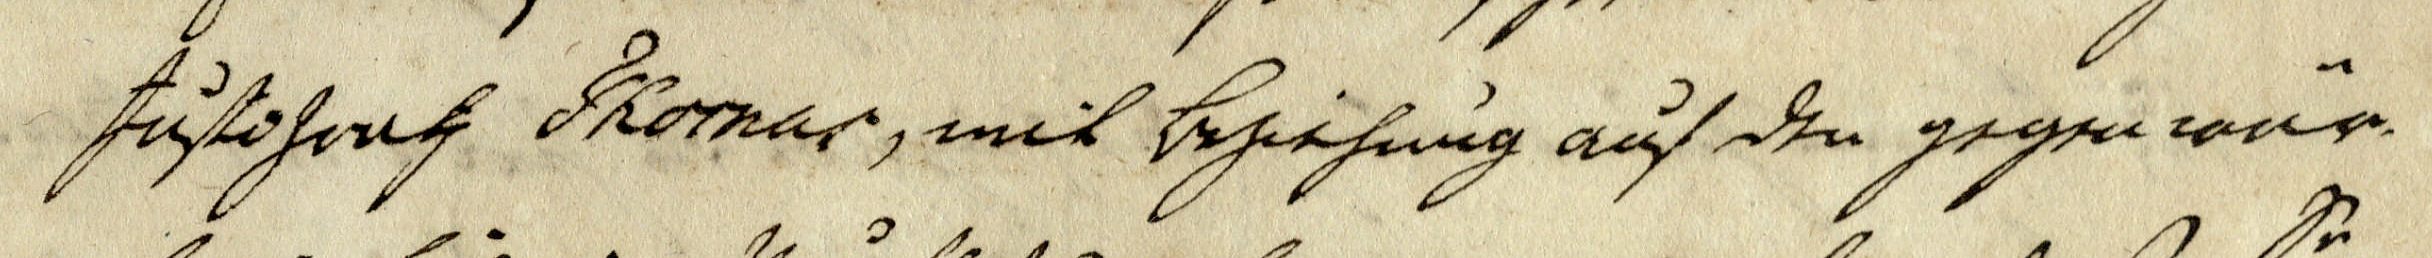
Justizrath Thomas, mit Beziehung auf den gegenwär¬
